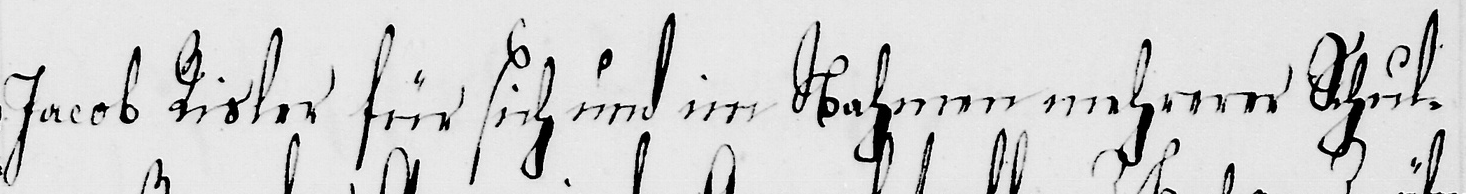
Jacob Risler für sich und im Nahmen mehrerer Schul¬
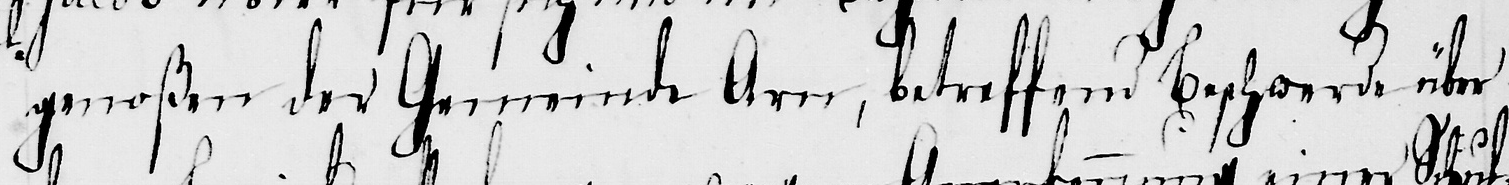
genoßen der Gemeinde Arn, betreffend Beschwerde über
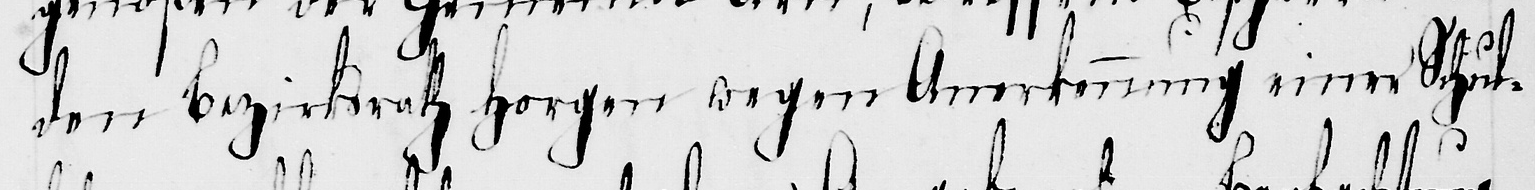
den Bezirksrath Horgen wegen Anerkennung einer Schul¬
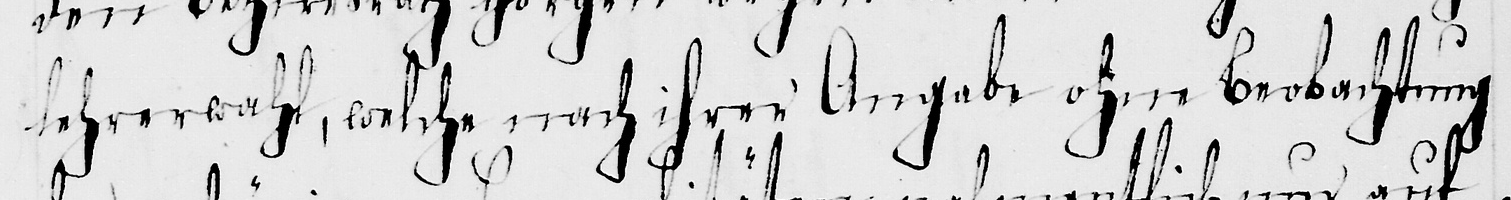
lehrerwahl, welche nach ihrer Angabe ohne Beobachtung
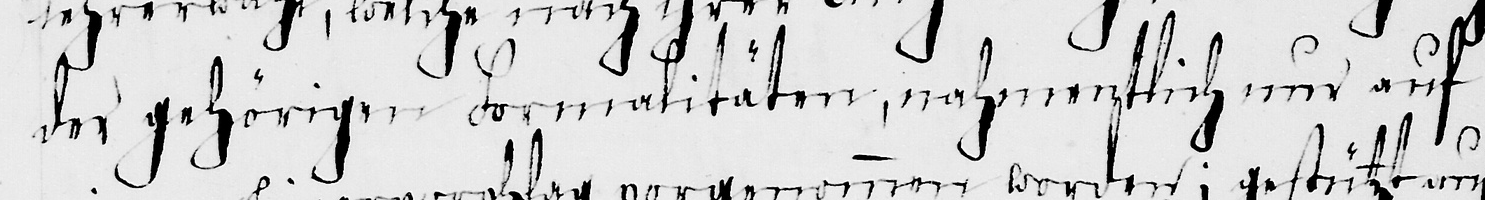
der gehörigen Formalitäten, nahmentlich nur auf
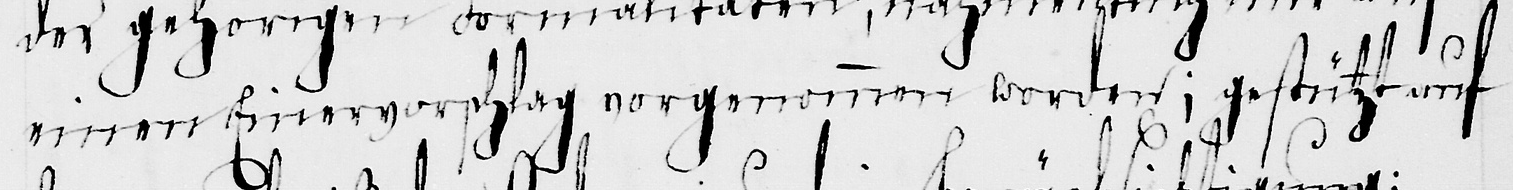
einen Einervorschlag vorgenommen worden; gestützt auf
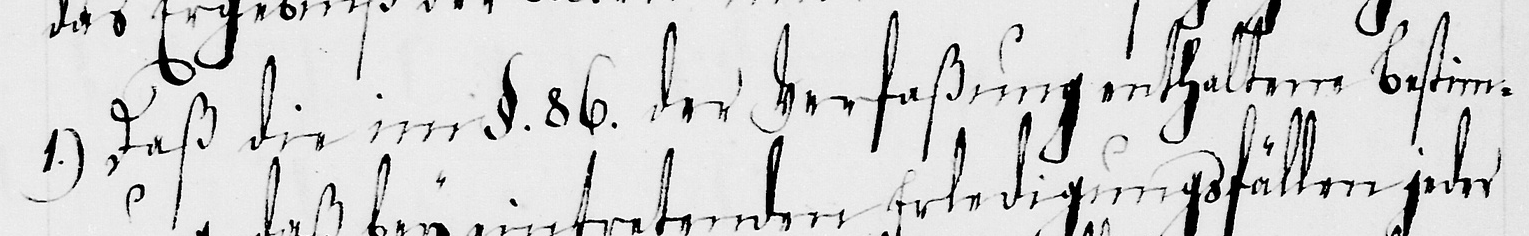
1.) Daß die im §. 86. der Verfaßung enthaltene Bestim¬
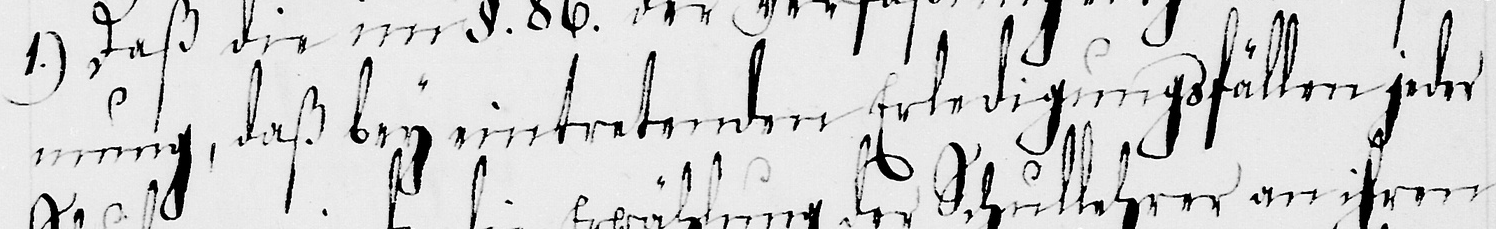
mung, daß bey eintretenden Erledigungsfällen jeder
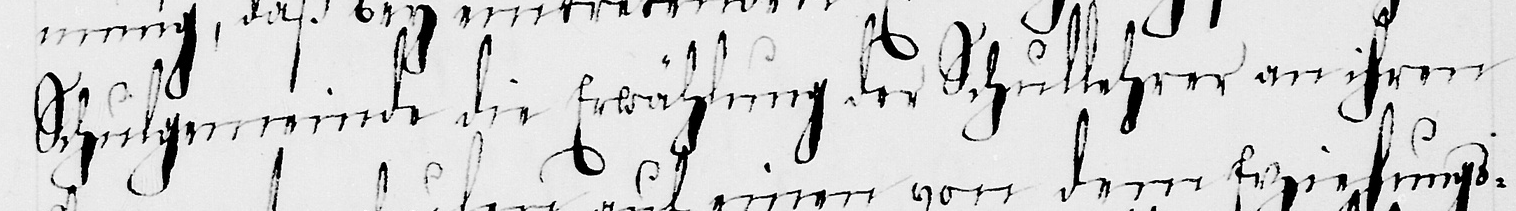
Schulgemeinde die Erwählung der Schullehrer an ihren
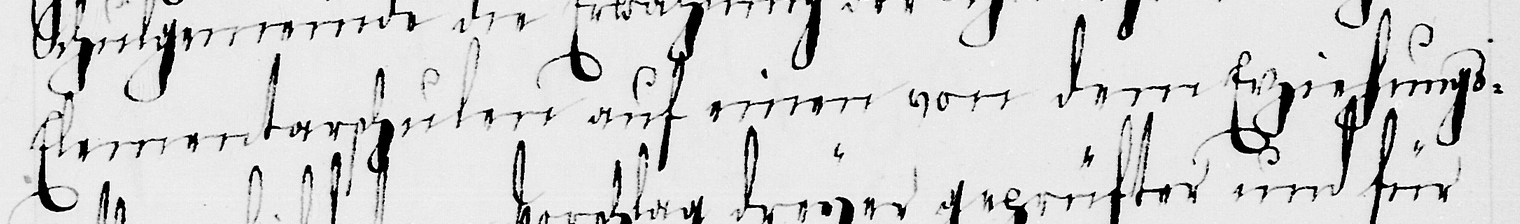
Elementarschulen auf einen von dem Erziehungs¬
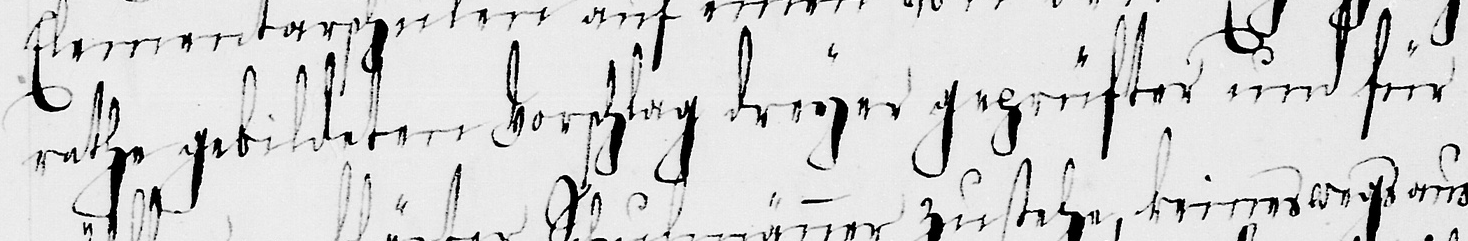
rathe gebildeten Vorschlag dreyer geprüfter und für
